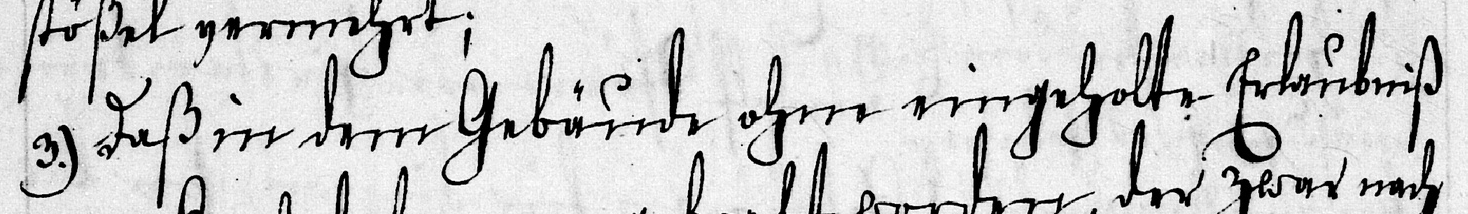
3.) Daß in dem Gebäude ohne eingeholte Erlaubniß
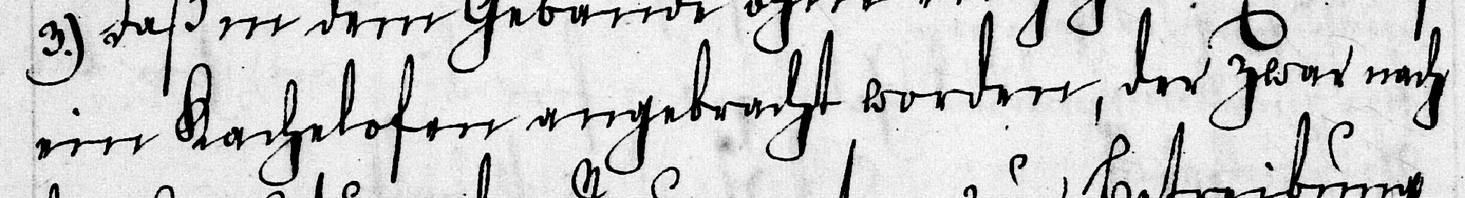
ein Kachelofen angebracht worden, der zwar nach
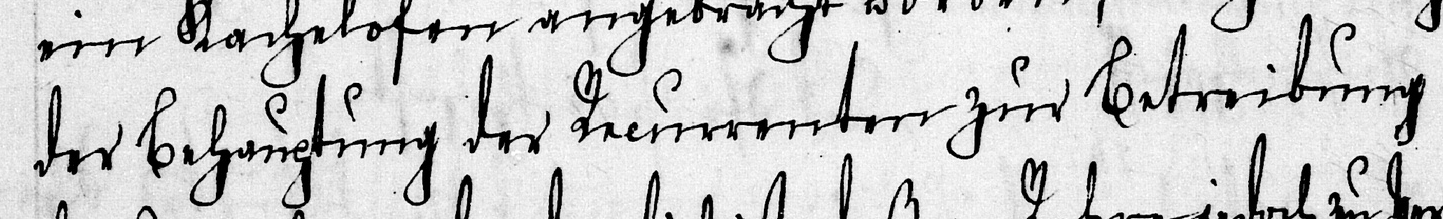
der Behauptung der Recurrenten zur Betreibung
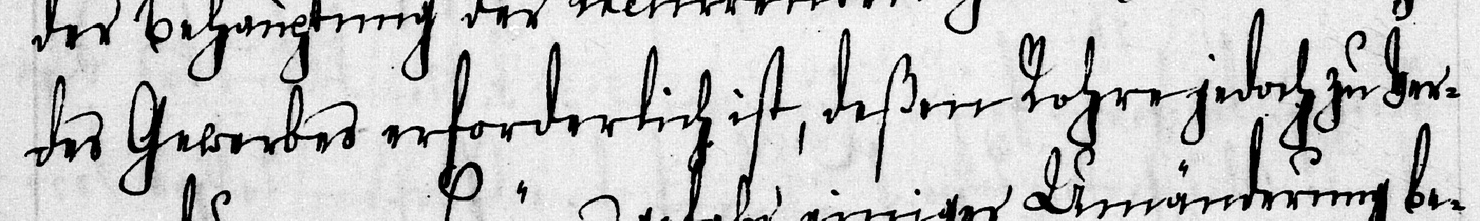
des Gewerbes erforderlich ist, deßen Rohre jedoch zu Ve¬
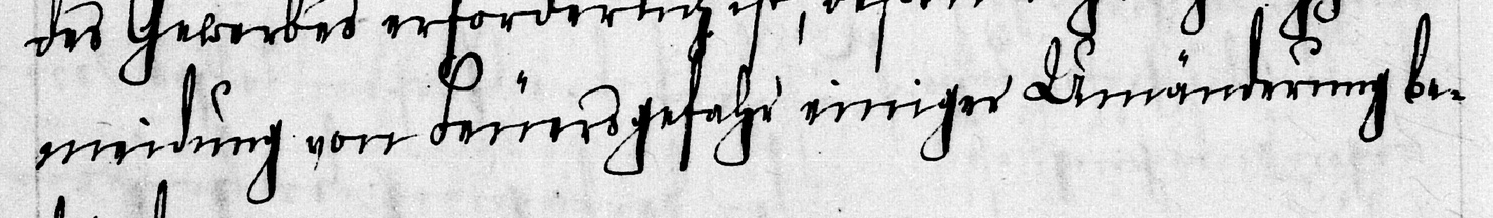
rmeidung von Feuersgefahr einiger Umänderung be¬
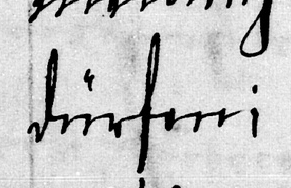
dürfen;
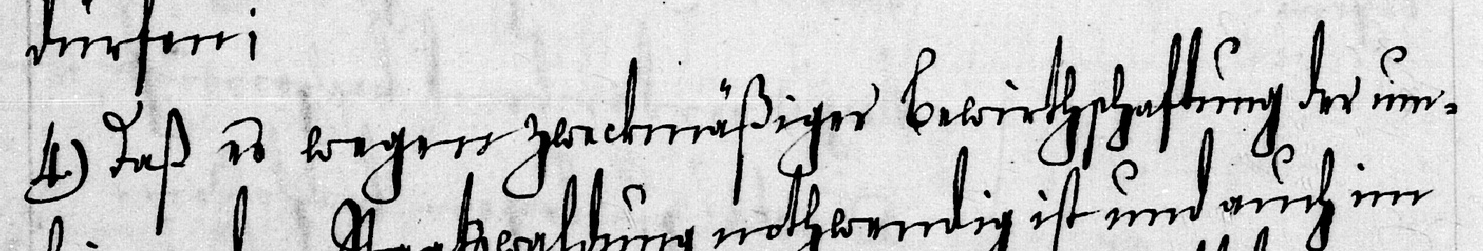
4.) Daß es wegen zweckmäßiger Bewirthschaftung der um¬
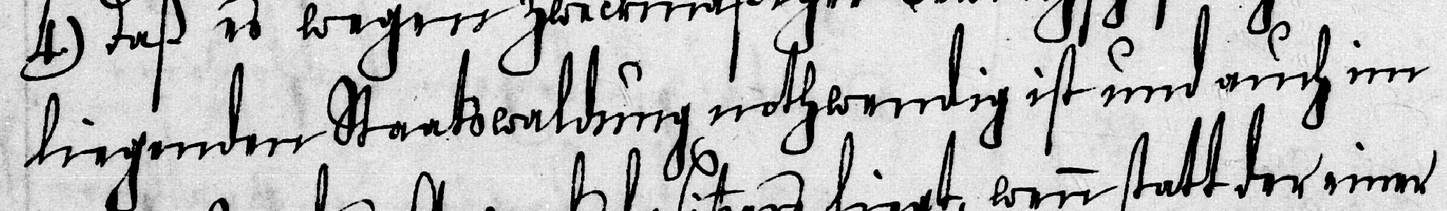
liegenden Staatswaldung nothwendig ist und auch im
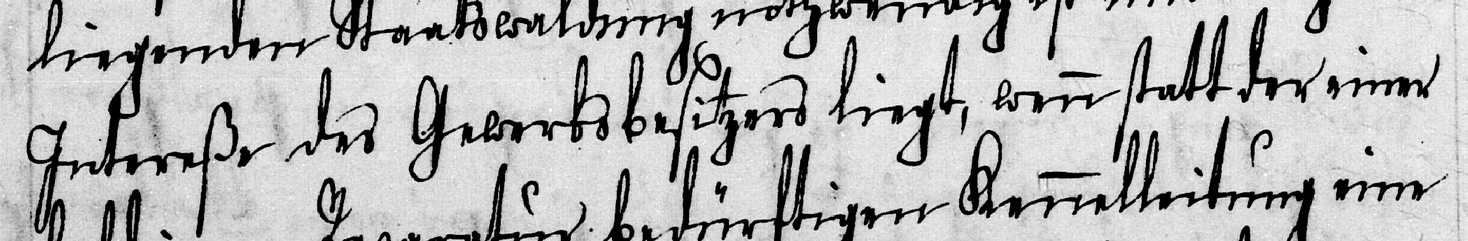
Intereße des Gewerbsbesitzers liegt, wenn statt der einer
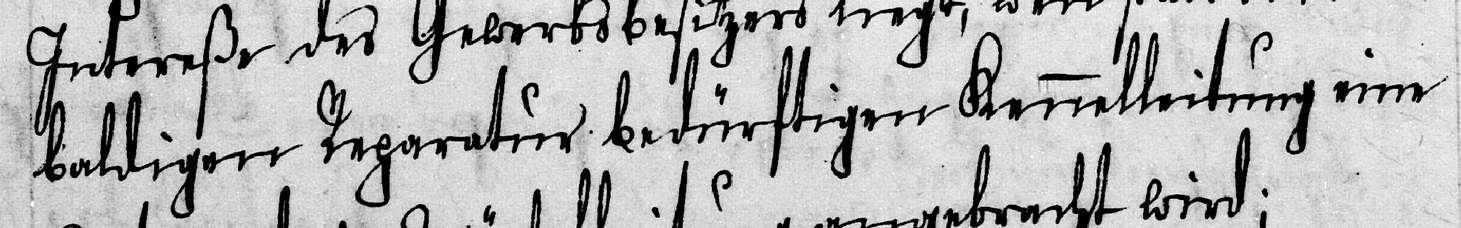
baldigen Reparatur bedürftigen Kennelleitung eine
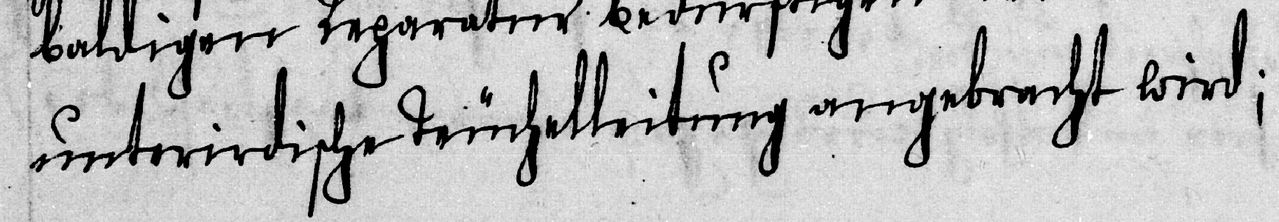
unterirdische Teuchelleitung angebracht wird;
